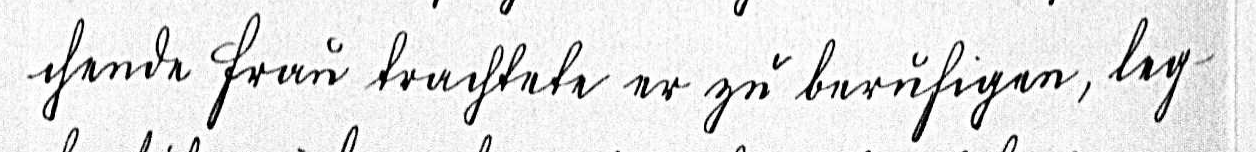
chende Frau trachtete er zu beruhigen, leg¬
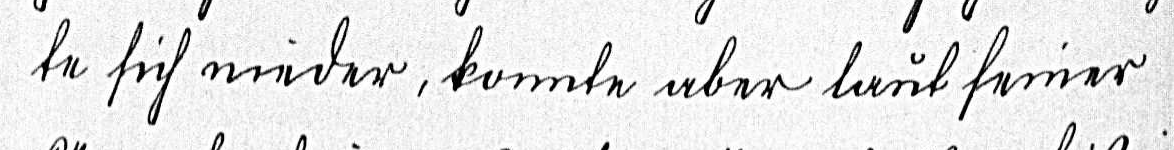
te sich nieder, konnte aber laut seiner
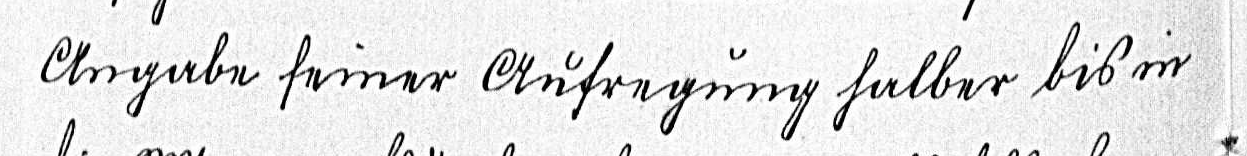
Angabe seiner Aufregung halber bis in
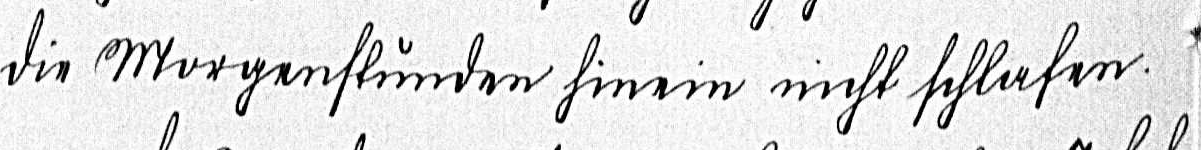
die Morgenstunden hinein nicht schlafen.
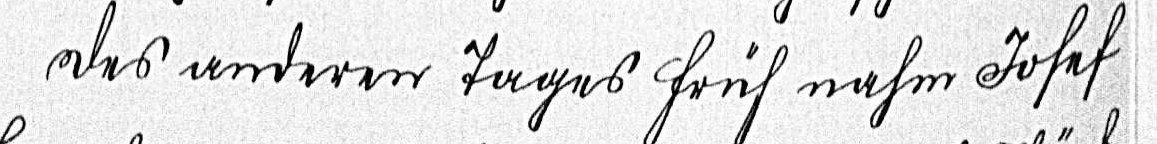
Das anderer Tages früh nahm Josef
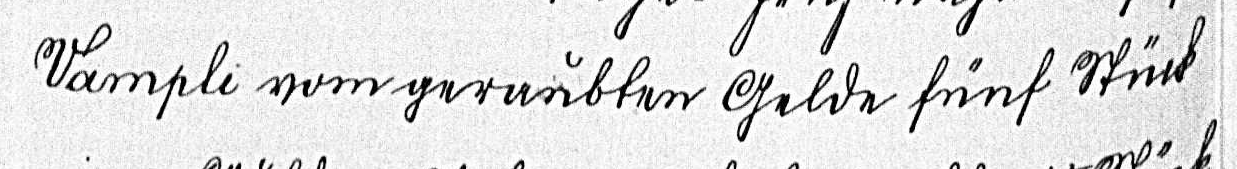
Vampli vom geraubten Gelde fünf Stück
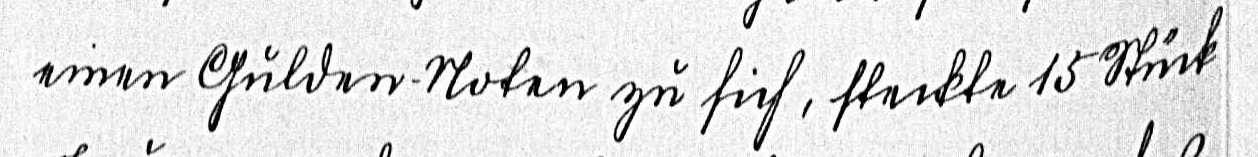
einen Gulden-Noten zu sich, steckte 15 Stück
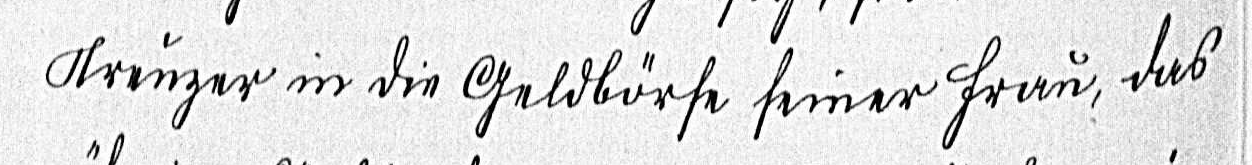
Kreuzer in die Geldbörse seiner Frau, das
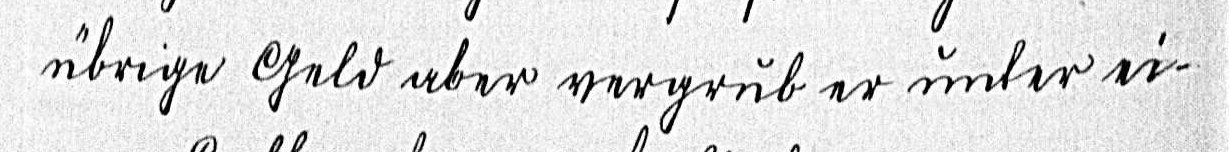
übrige Geld aber vergrub er unter ei¬
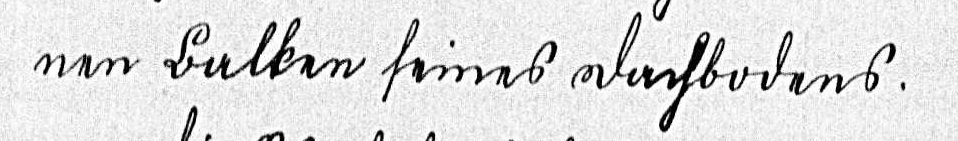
nen Balken seines Dachbodens.
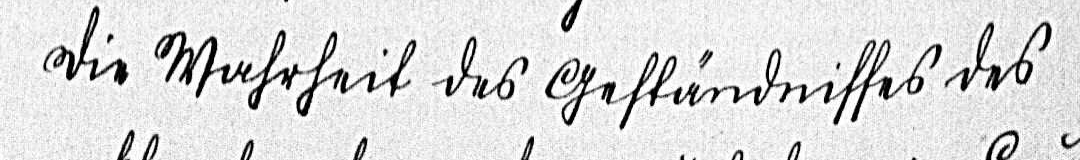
Die Mehrheit des Geständnisses des
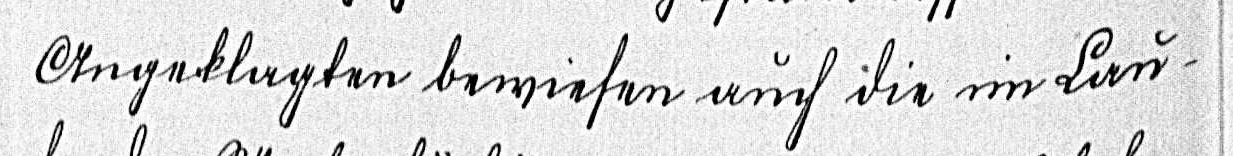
Angeklagten bewiesen auch die im Lau¬
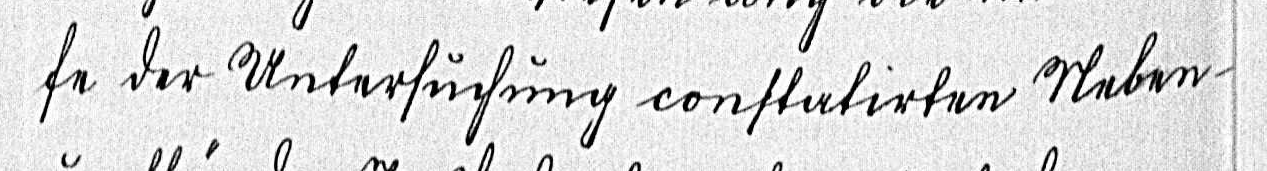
fe der Untersuchung constatirten Neben¬
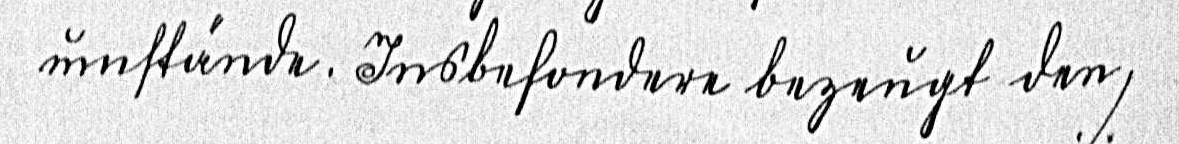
umstände, Insbesondere bezeugt den
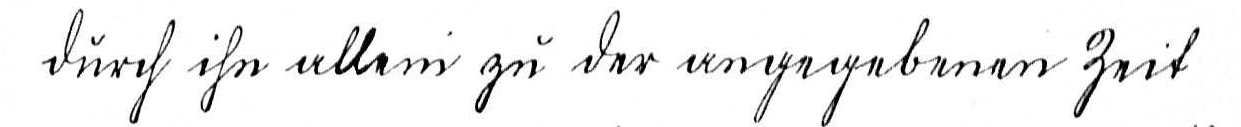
durch ihn allem zu der angegebenen Zeit
